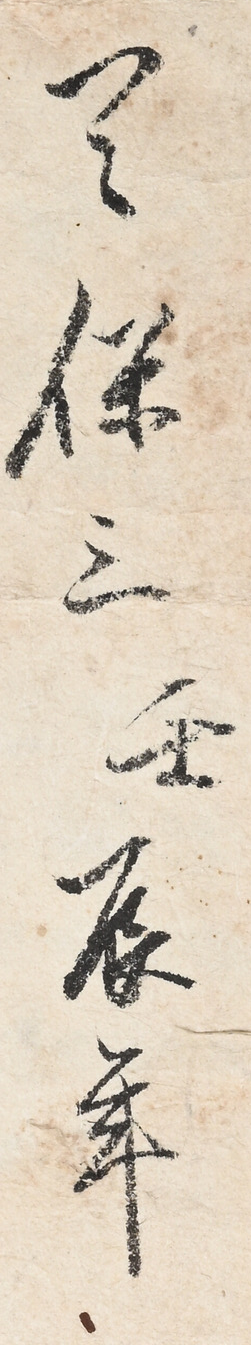天保三壬辰年
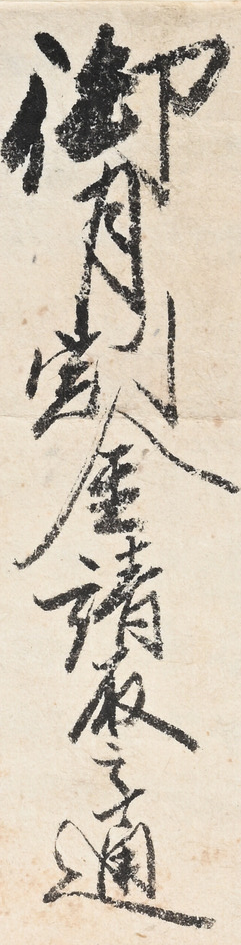御月割金請取之通
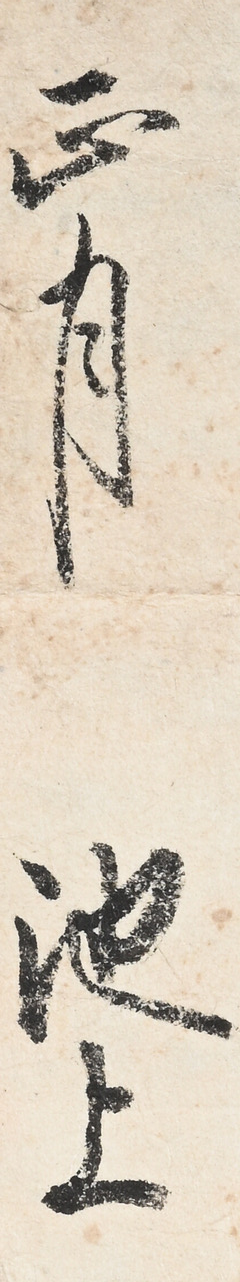正月池上
